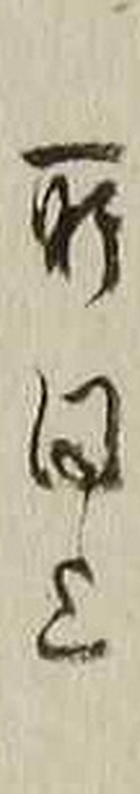母同上
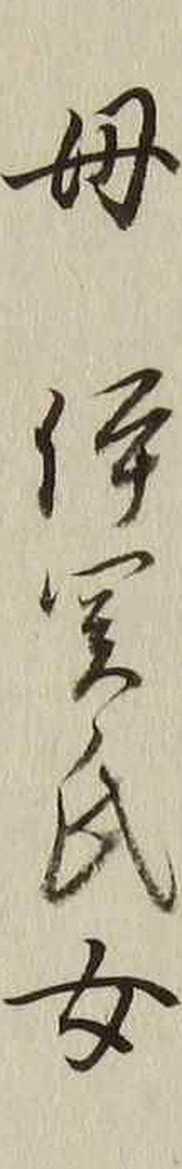母伊関氏女
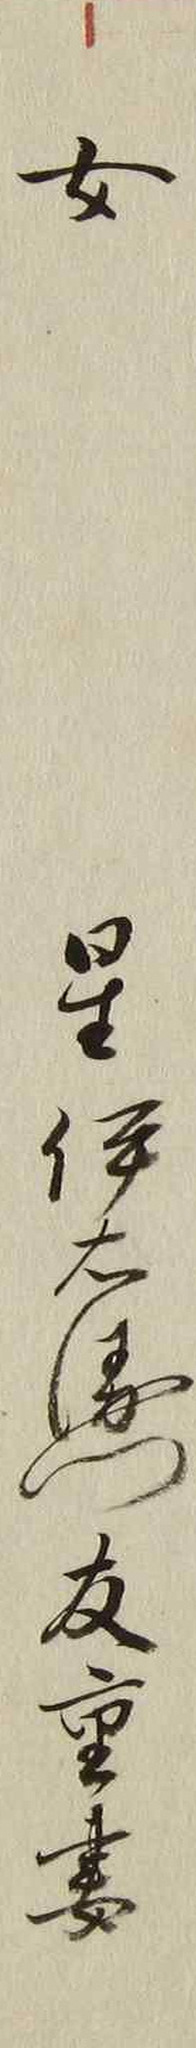女星伊右衛門友重妻
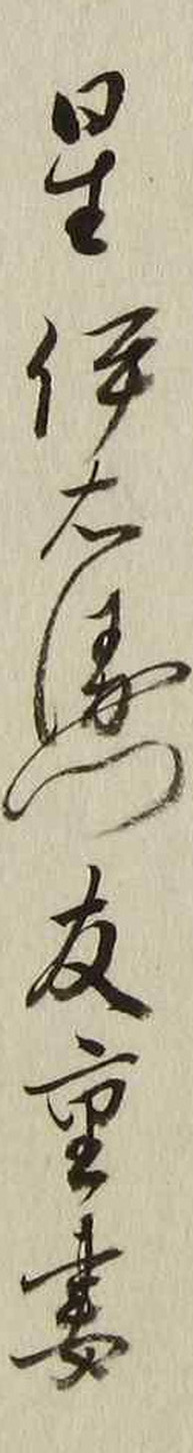女星伊右衛門友重妻
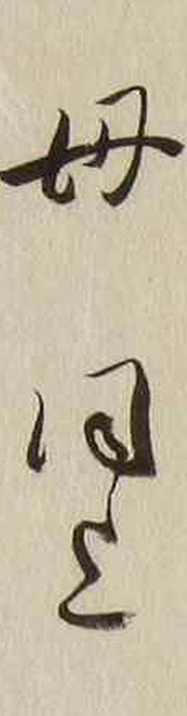母同上

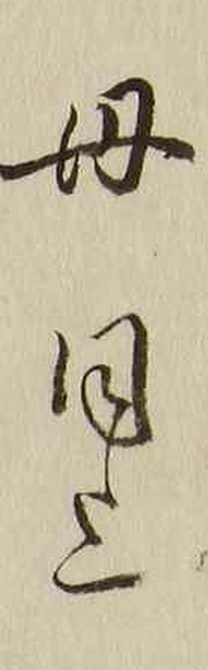母同上
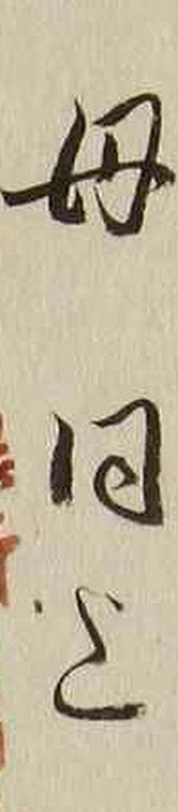母同上
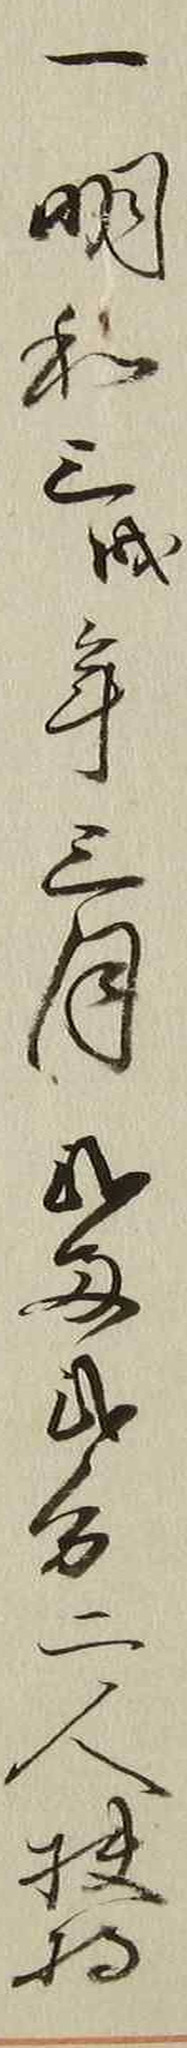一明和三戌年三月弐両弐分二人扶持
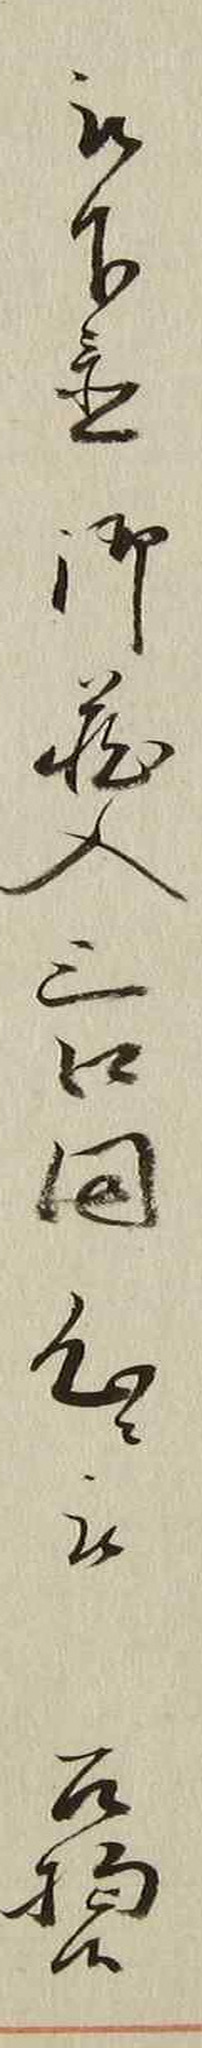被下置御蔵入三口同心ニ被召抱候
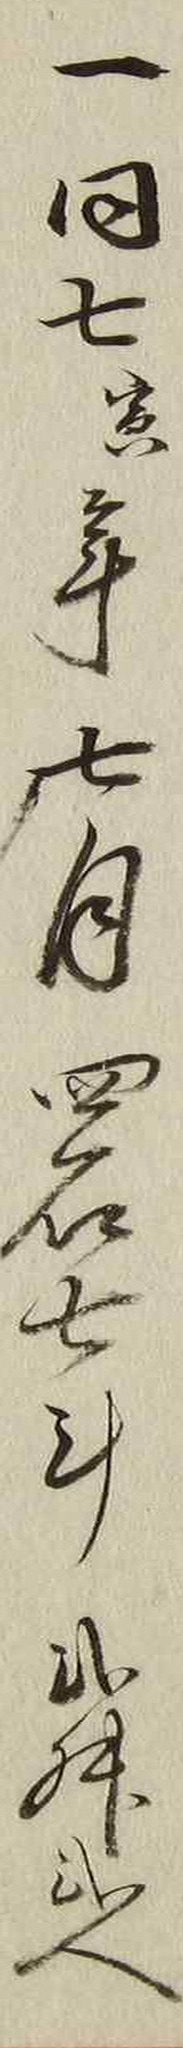一同七寅年七月四石七斗弐升弐人
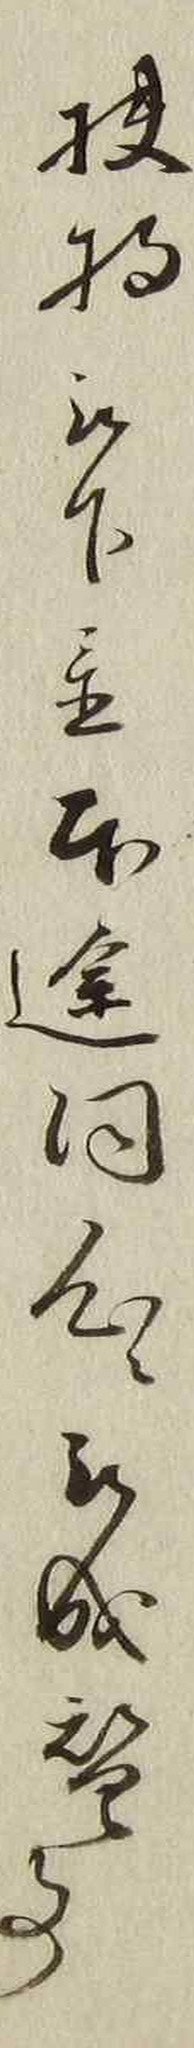扶持被下置本途同心ニ被成替候事
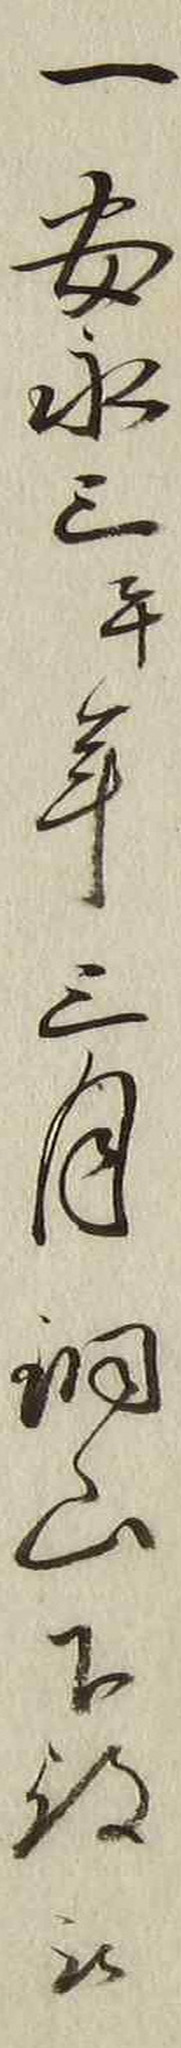一安永三午年三月銅山下役被
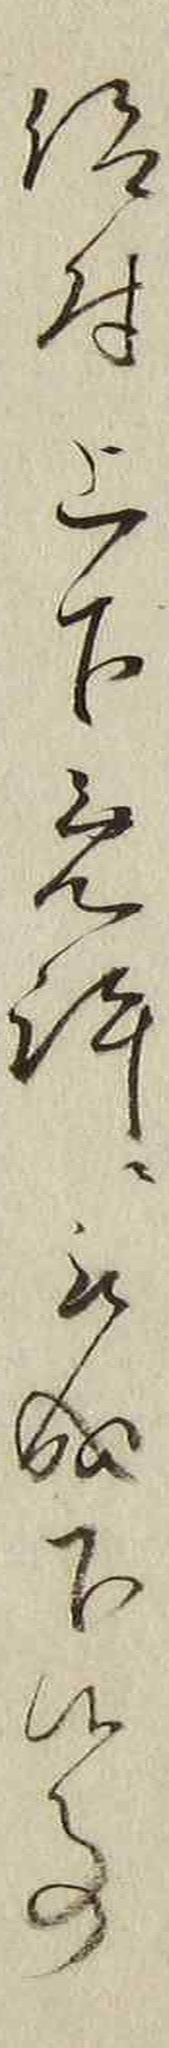仰付上下免許ニ被成下候事
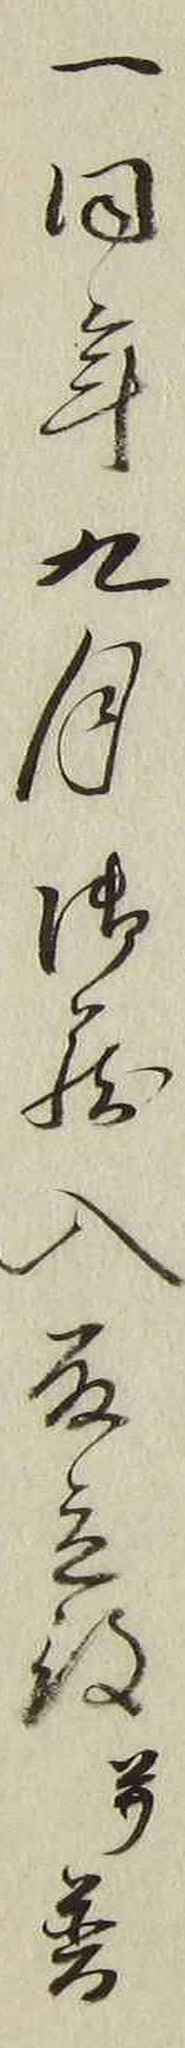一同年九月御蔵入取立役幷普
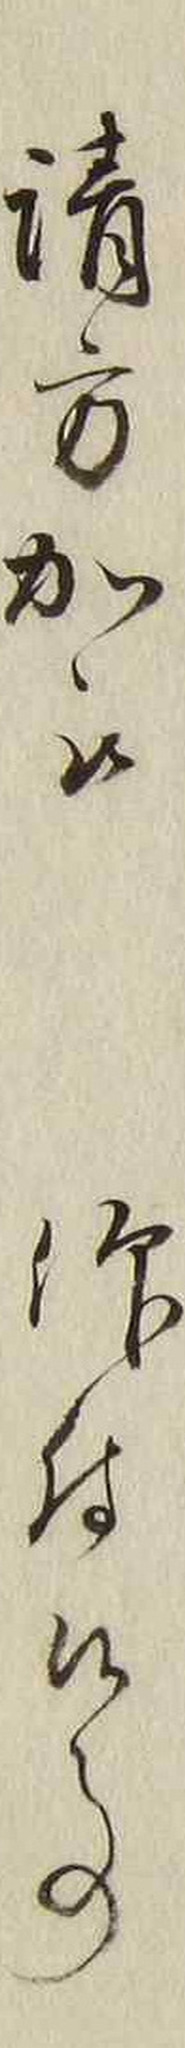請方加被仰付候事
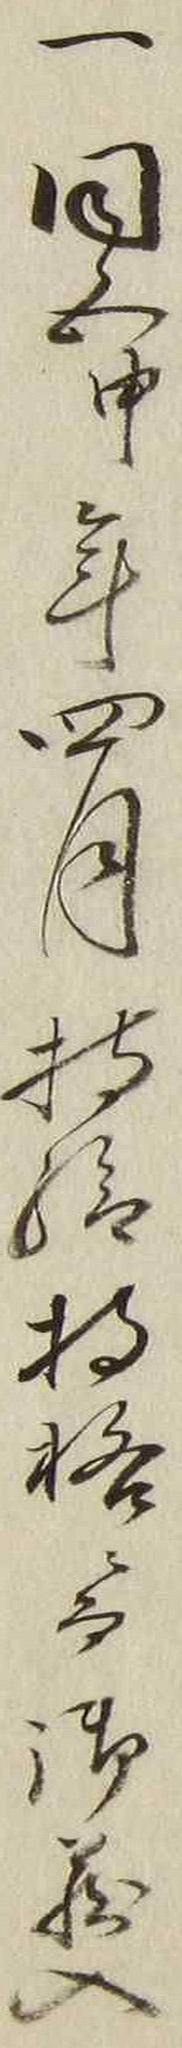一同五申年四月持給持格ニ而御蔵入
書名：諸士系譜　巻之52　に之部3
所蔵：会津若松市立会津図書館
